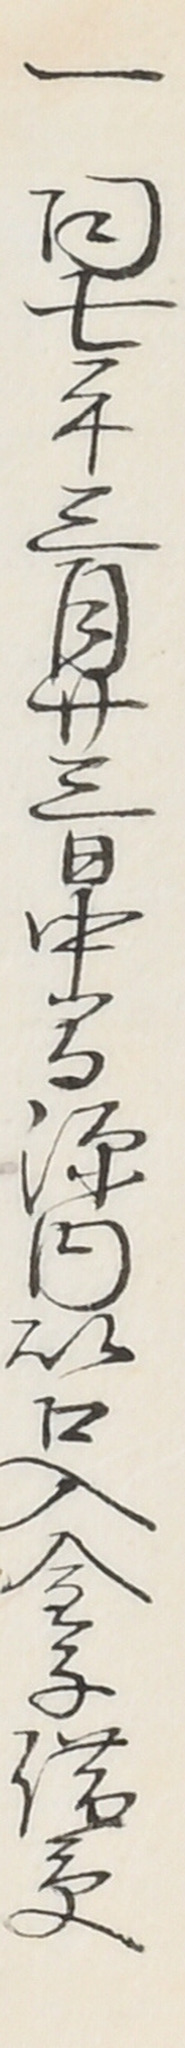一同七午三月廿三日中間源内以口入金子借受
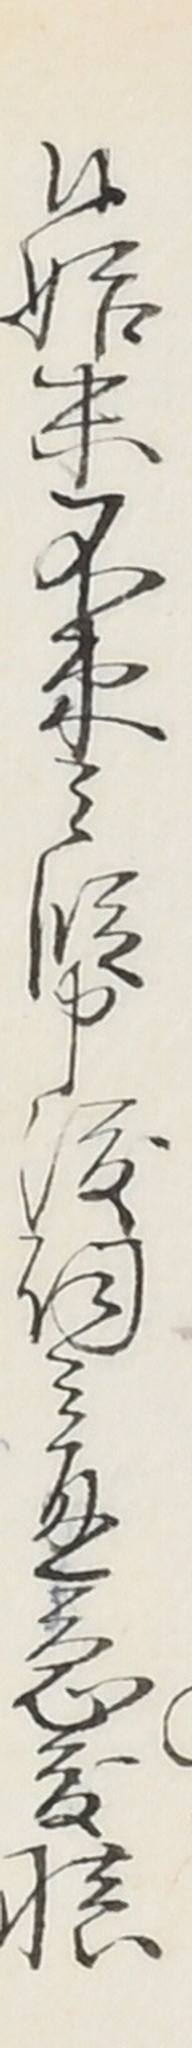候始末不束之段申渡伺之通急度慎
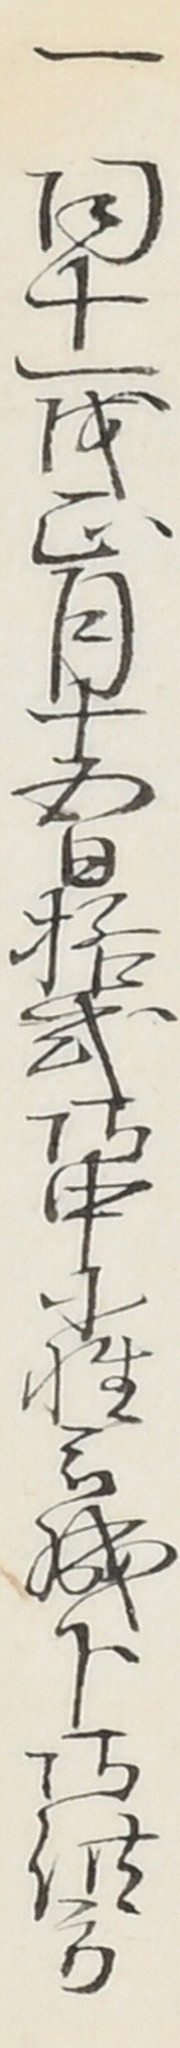一同十一戌正月十五日格式御中小性被成下御供方
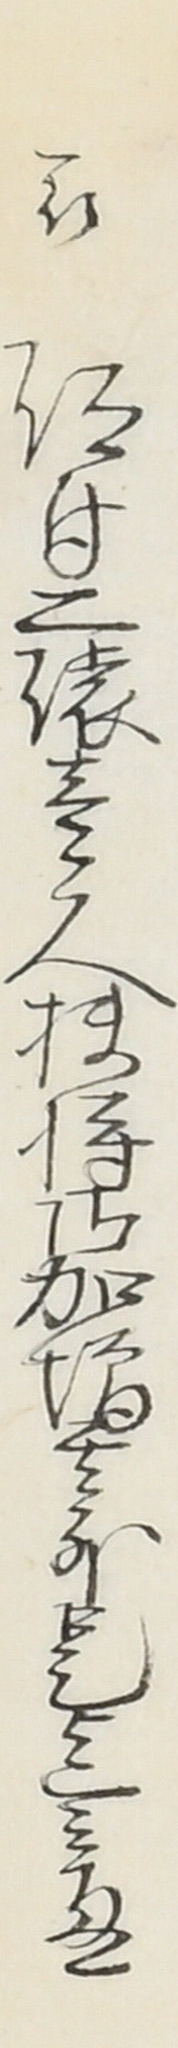被仰付二俵壱人扶持御加増其外是迄之通
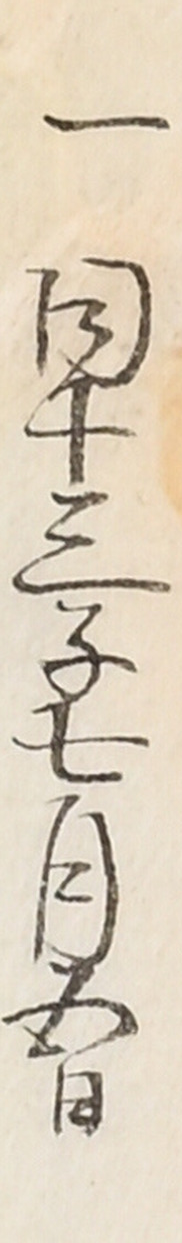一同十三子七月五日
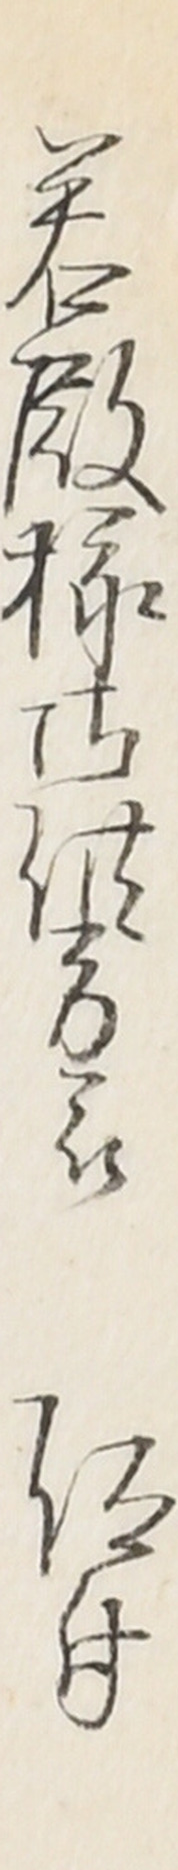若殿様御供方被仰付
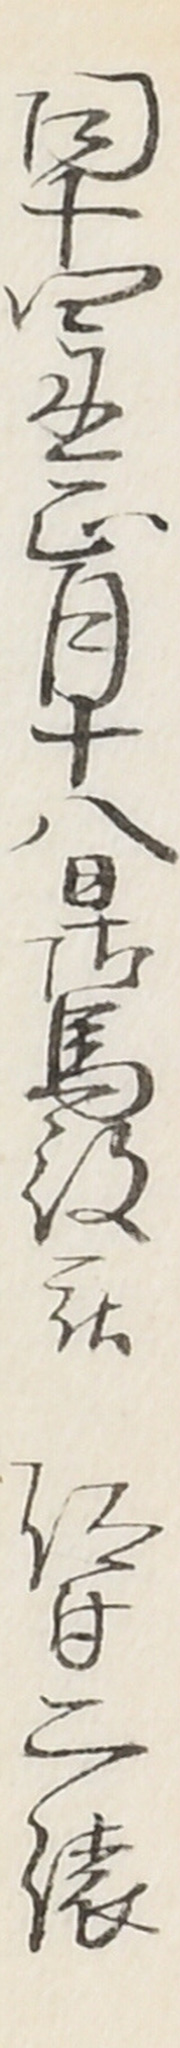一同十四丑正月十八日御馬役被仰付二俵
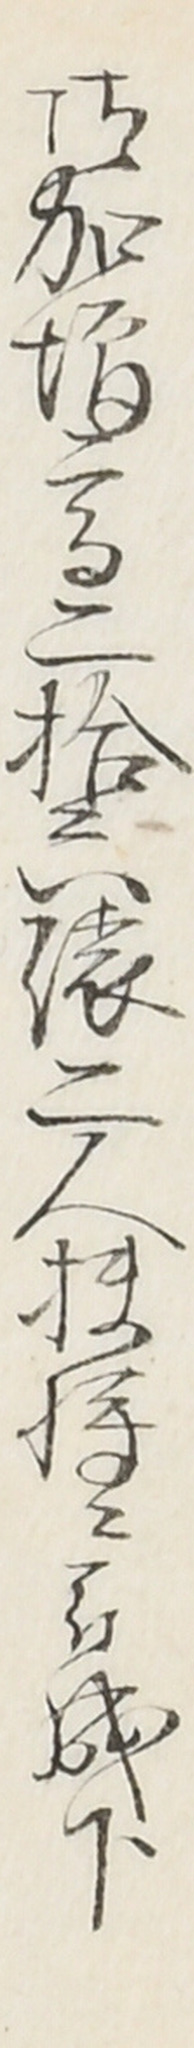御加増高ニ拾六俵二人扶持ニ被被下
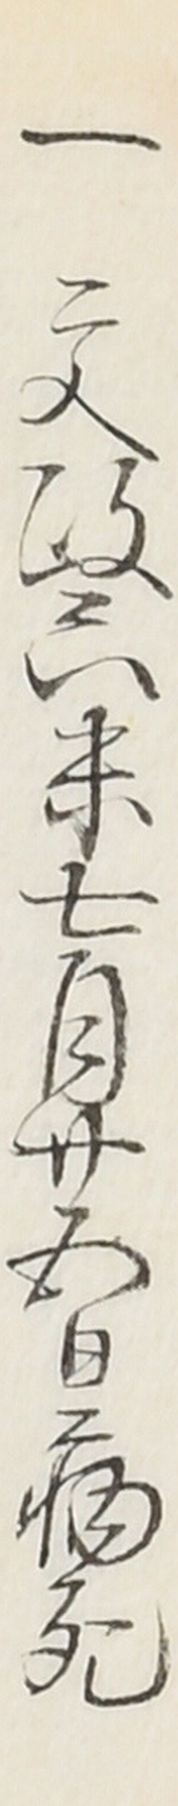一文政六未七月廿五日病死
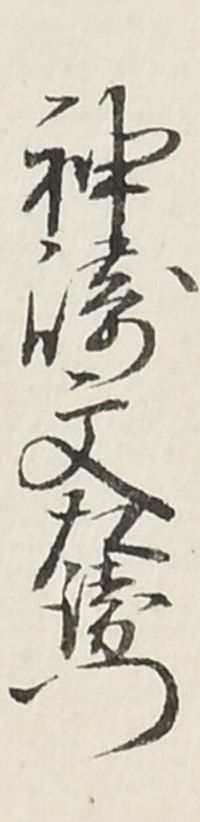神崎文左衛門
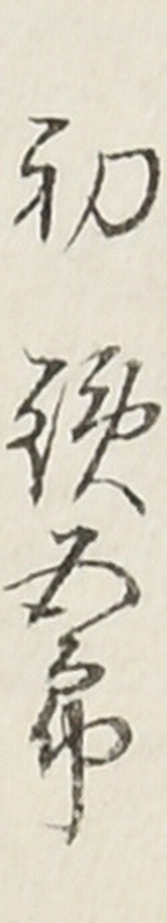初鉄五郎
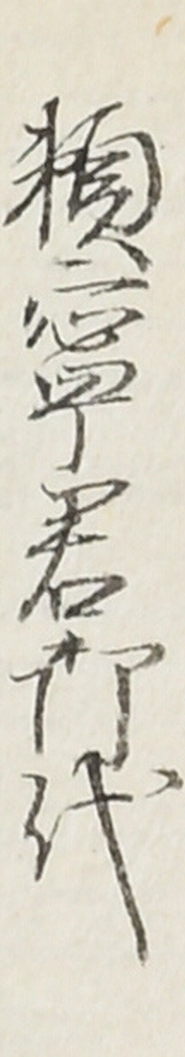頼寧君御代
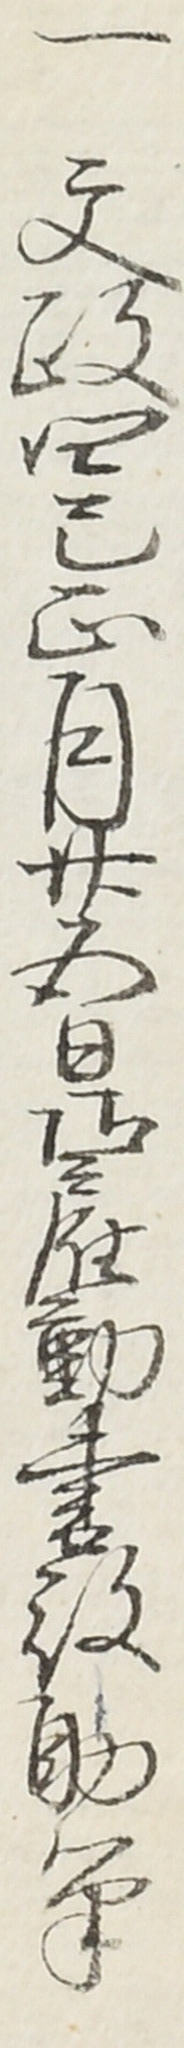一文政四巳正月廿五日御雇勤書役助筆
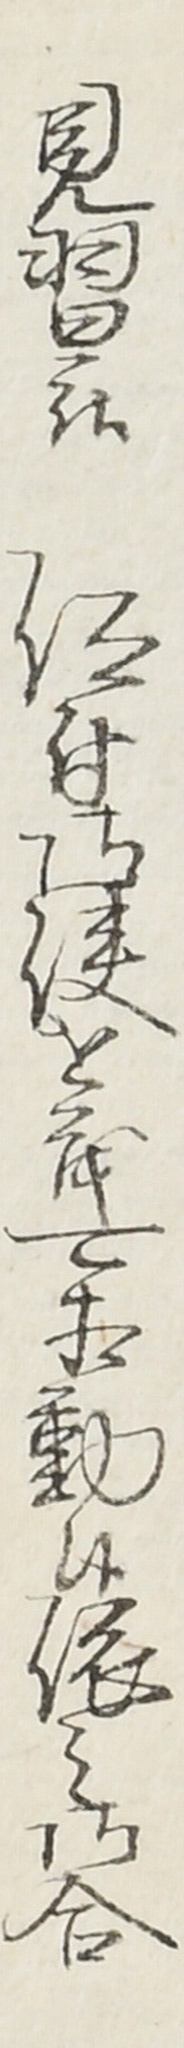見習被仰付御使を茂可相勤候依之御合
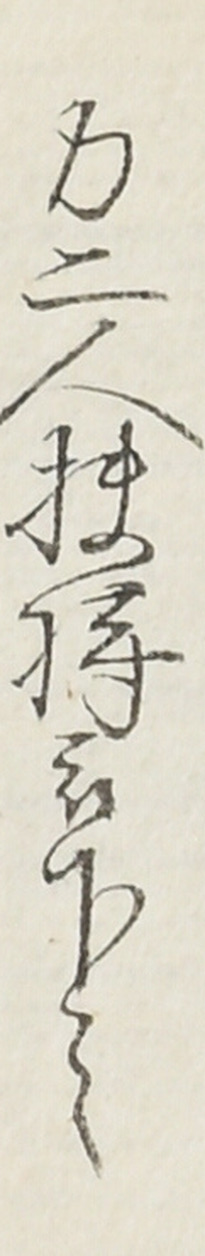力二人扶持被下之
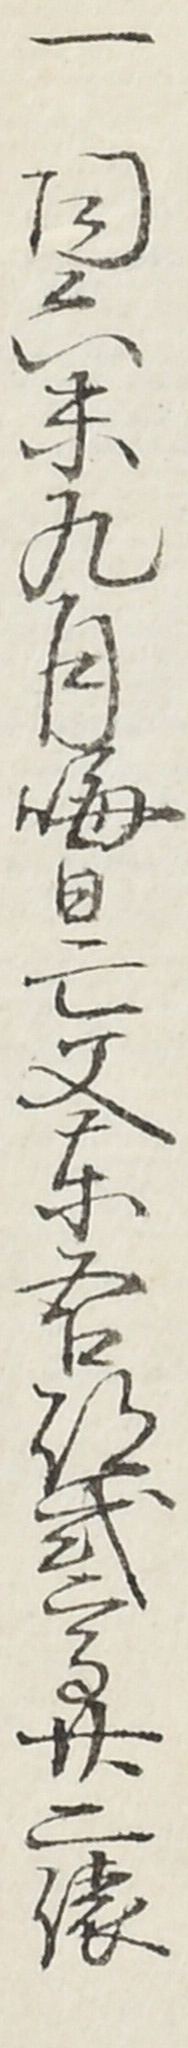一同六未九月晦日亡父東吾跡式高廿二俵
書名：給人諸士勤仕録（七）
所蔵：伊那市立高遠町図書館・合同会社AMANE
